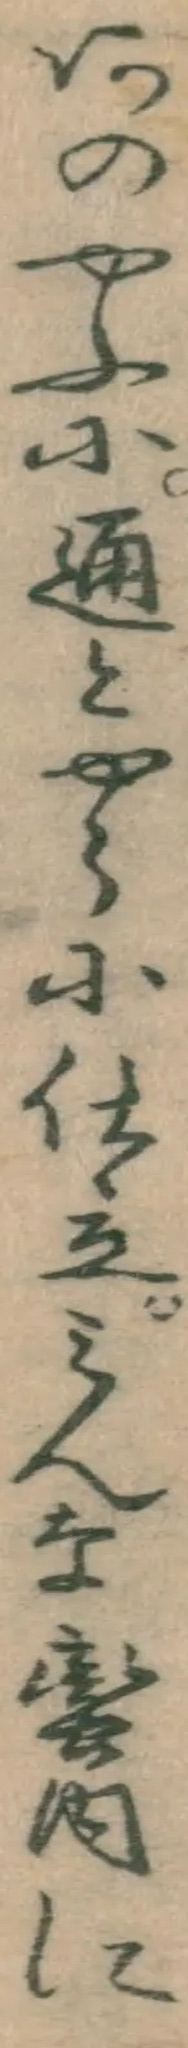あのやふに。通とやらに仕立。みんな蛮内に
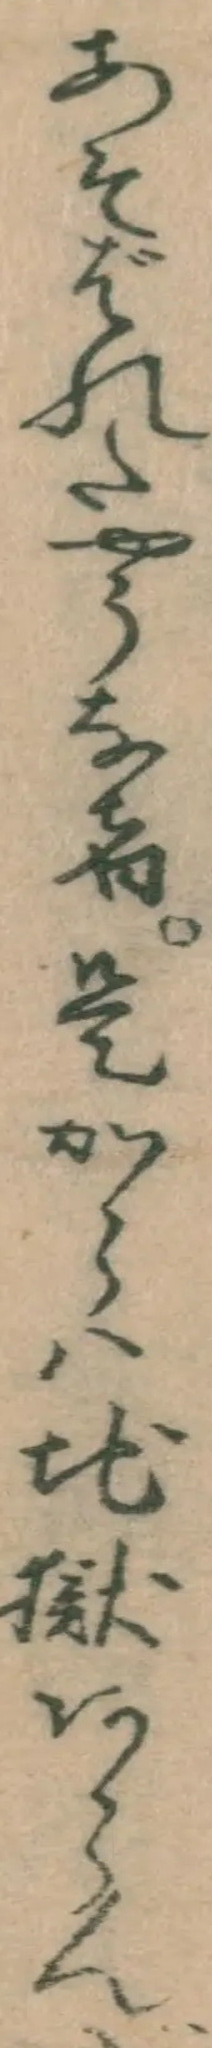あそばれたやうな者。是からは地獄あらん
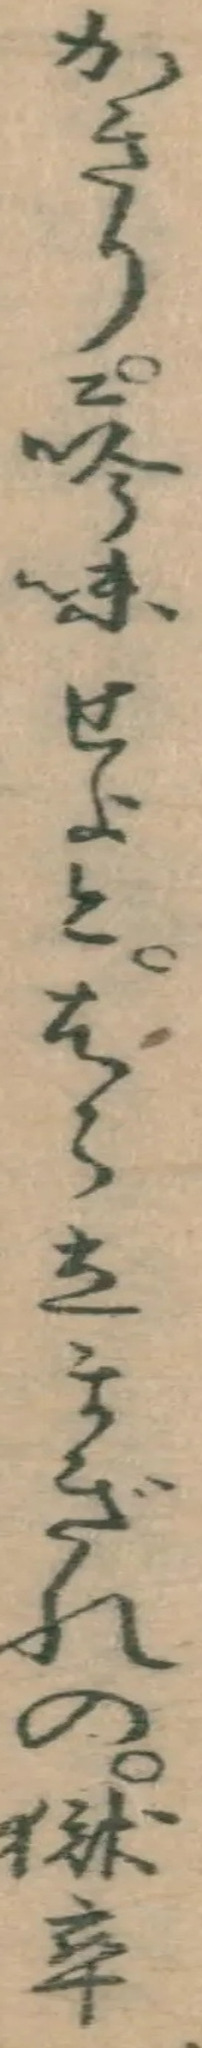かきり。こ吟味せよと。はら立まぎれの。獄卒
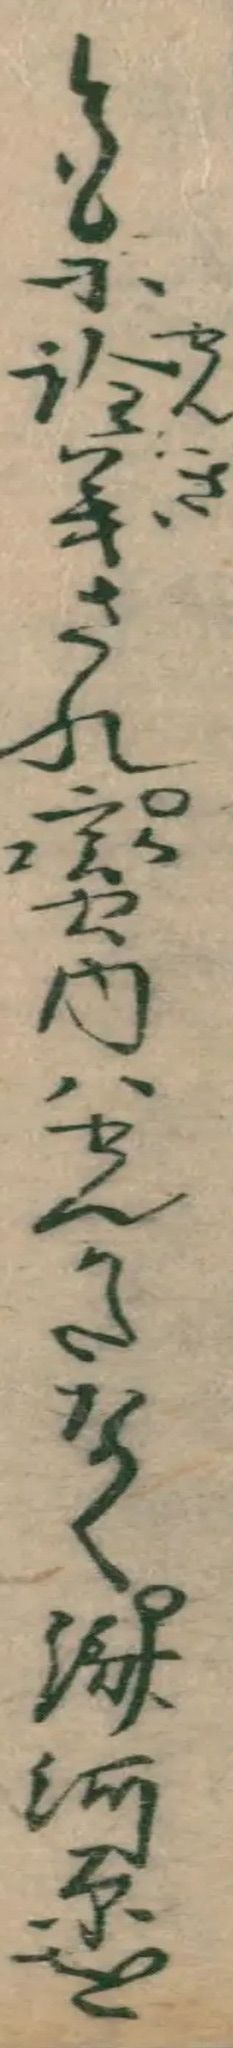ともに詮義され。蛮内はせんかたなく。済河原を
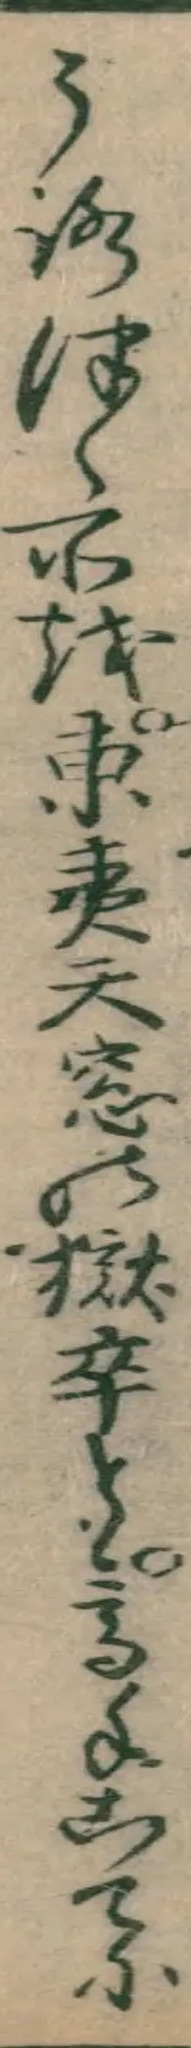うろつく所を。東夷天窓の獄卒とも。高手こてに
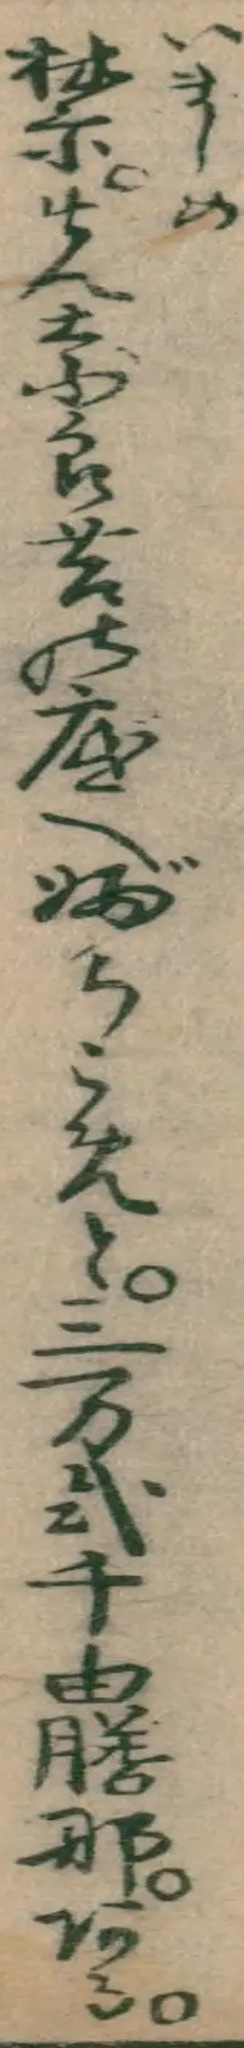禁。先なら苦の底へぶちこめと。三万弐千由膳那。ある。
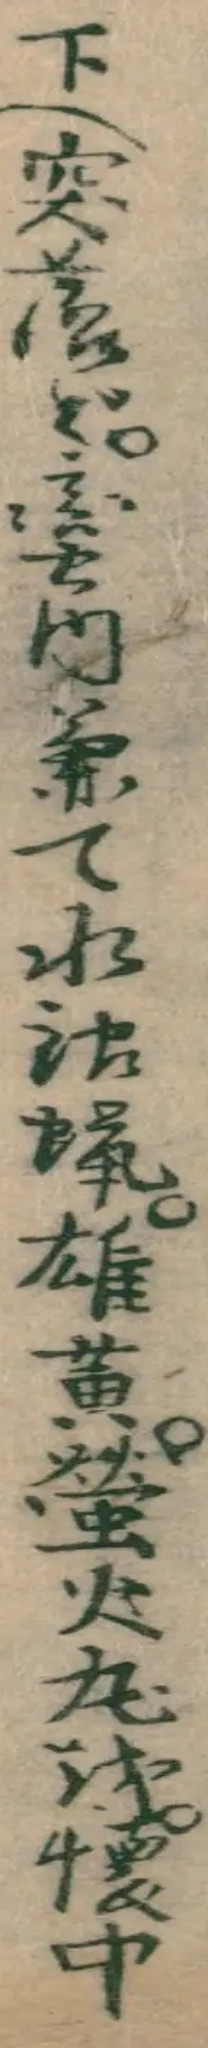下へ突落ど。蛮内兼て水銀蝋。雄黄。蛍火丸を。懐中
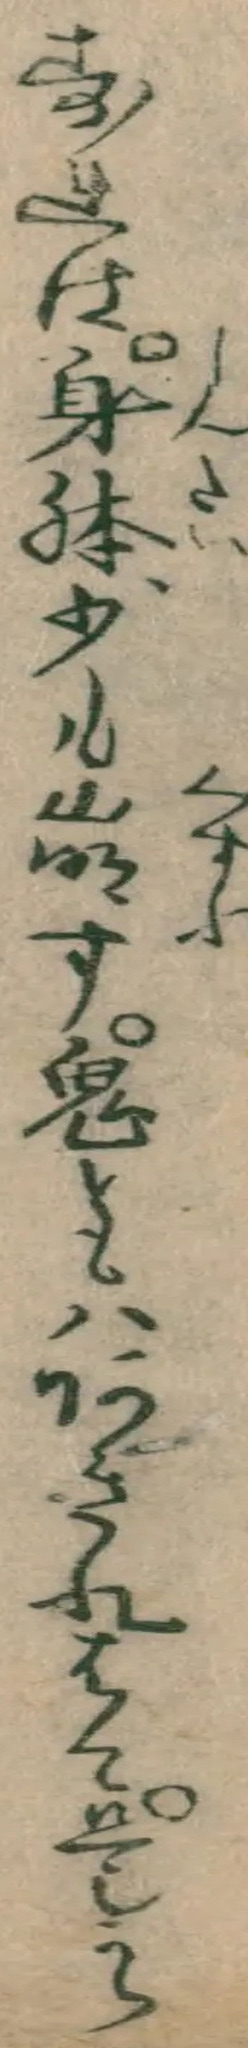すれは。身体少も崩す。鬼ともはあきれはて。是から
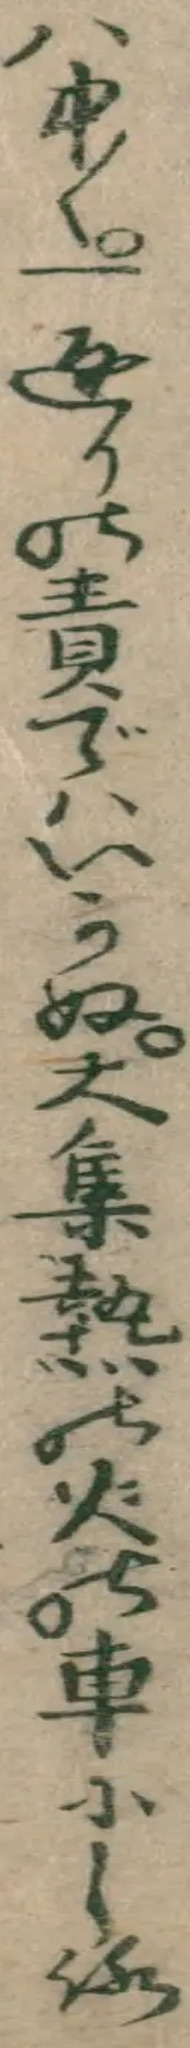は中〳〵。一通りの責ではいかぬ。大集熱の火の車にしろ
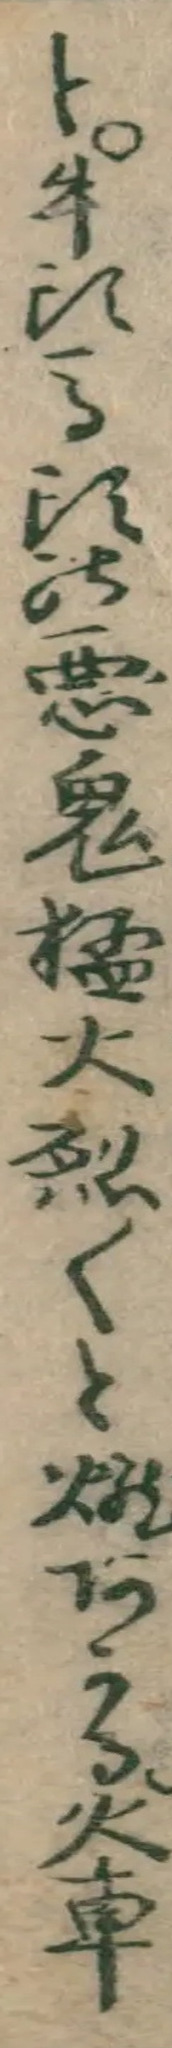と。牛頭馬頭の悪鬼。猛火烈〳〵と燃あかる。火車
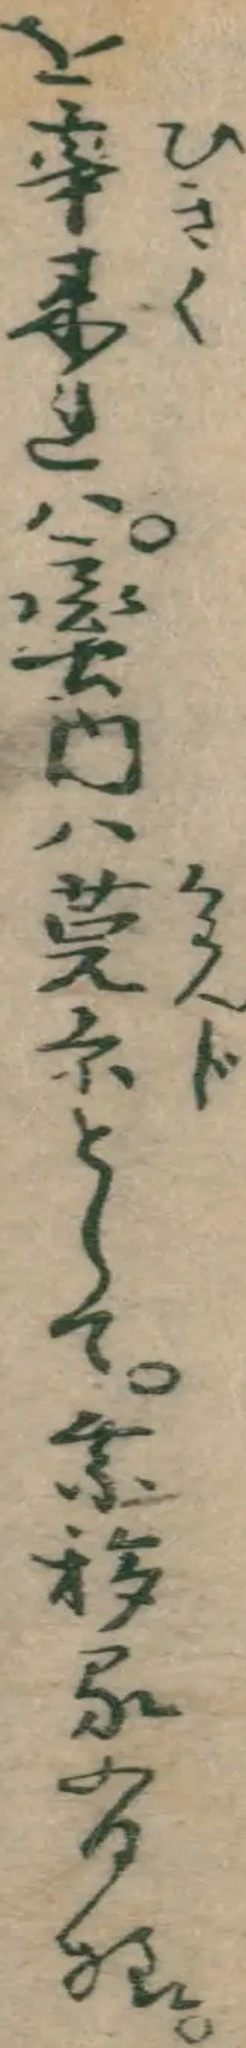を牽来れは。蛮内は莞爾として。乗移る有様。

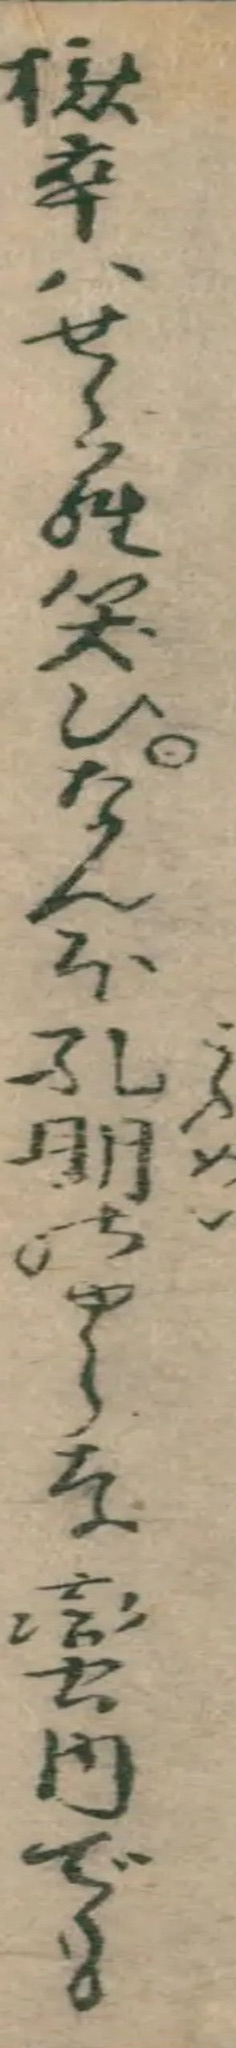獄卒はせゝら笑ひ。なんほ孔明のやうな蛮内でも
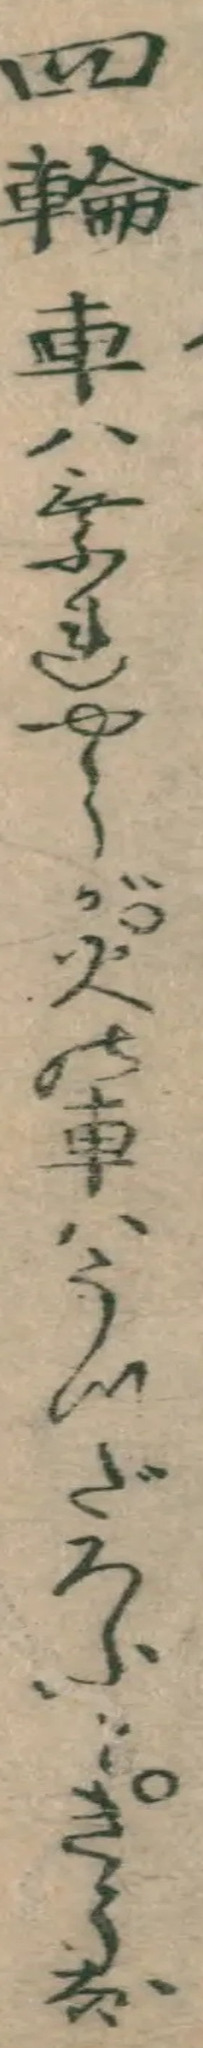四輪車は乗れやうが。火の車はうつだろふと。きうな
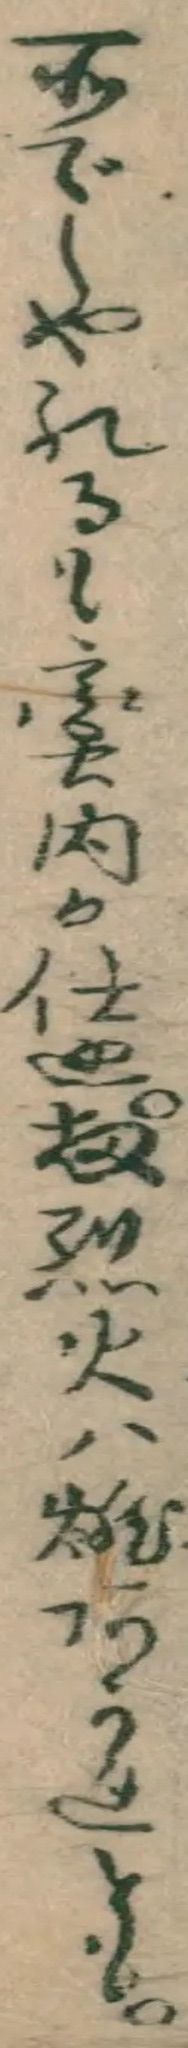所でしやれるも蛮内か仕廻。扨烈火は燃あかれとも。
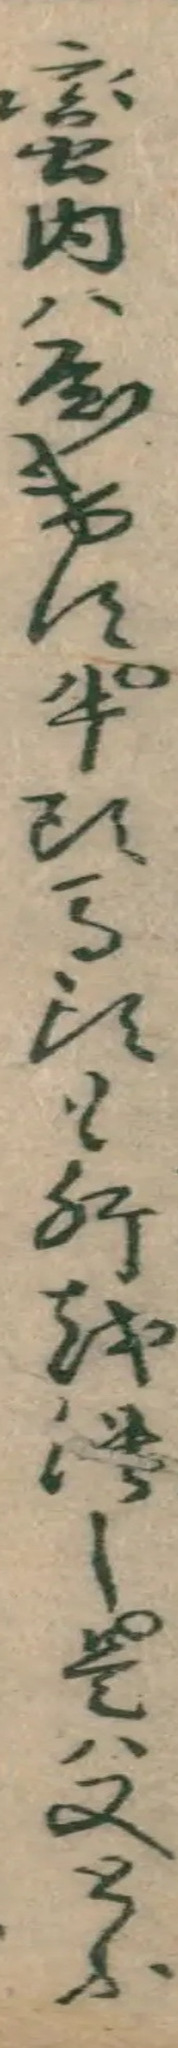蛮内はやけす。牛頭馬頭も肝を潰し。是は又とふ
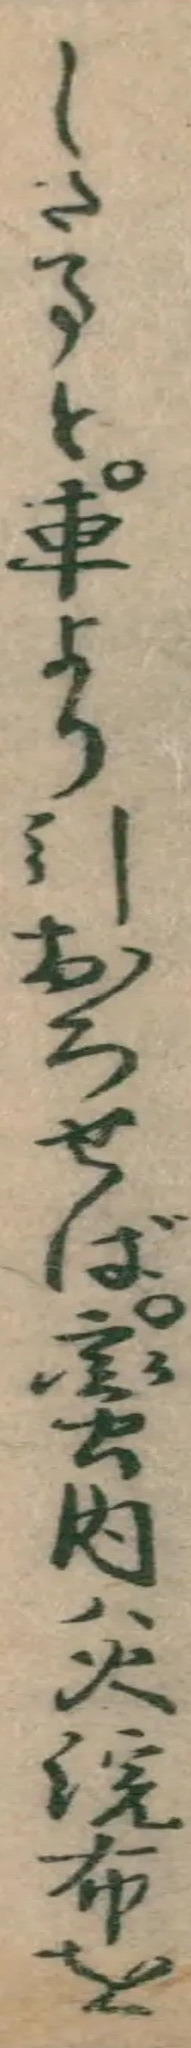した事と。車より引おろせば。蛮内は火浣布を
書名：翻草盲目
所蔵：国立国会図書館 National Diet Library, JAPAN
